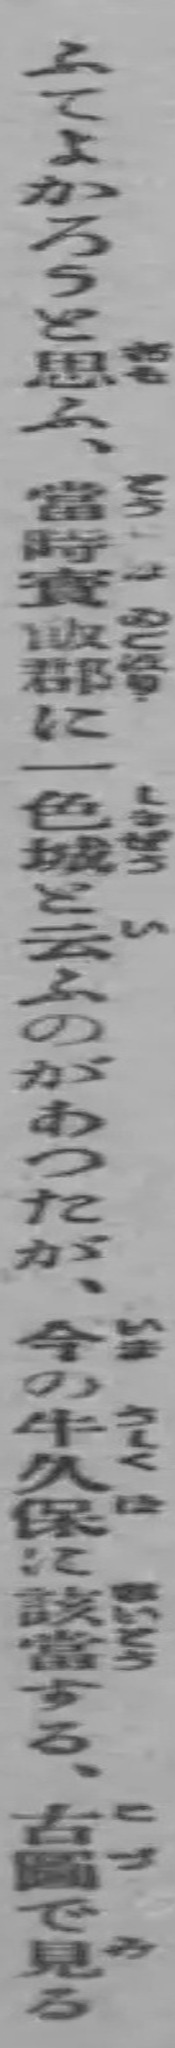一色城ふてよかろうと思ふ、当時宝飯郡に一色城と云ふのがあつたが、今の牛久保に該当する、古図で見る
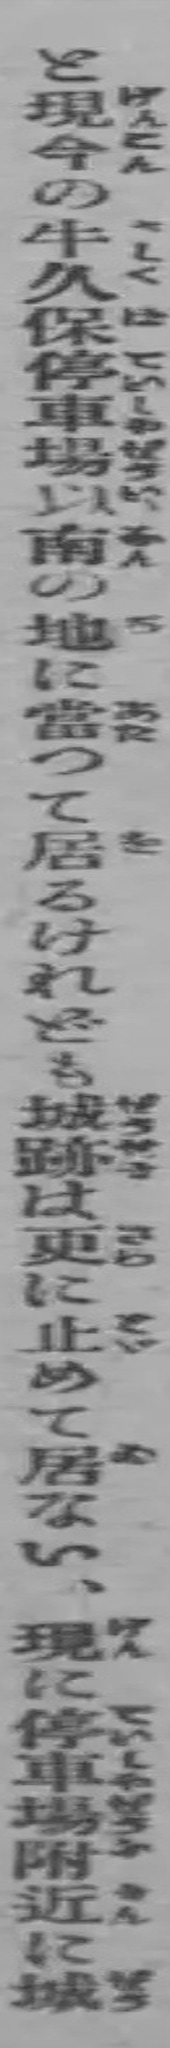と現今の牛久保停車場以南の地に当つて居るけれども城跡は更に止めて居ない、現に停車場附近に城
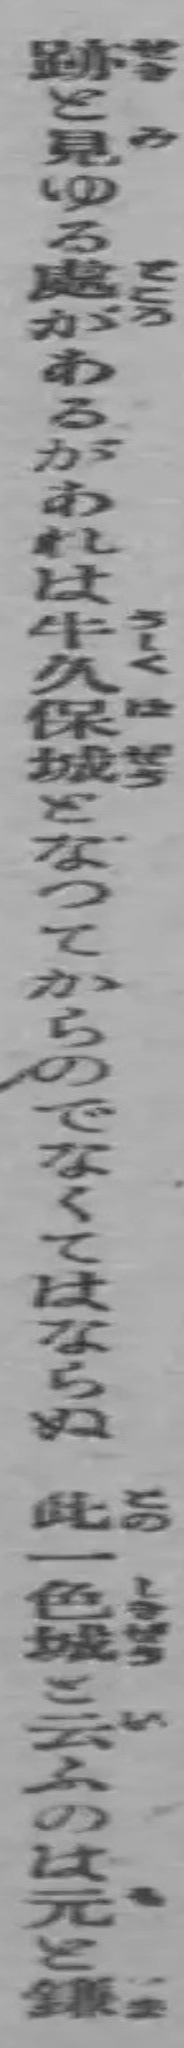跡と見ゆる処があるがあれは牛久保城となつてからのでなくてはならぬ此一色城と云ふのは元と鎌
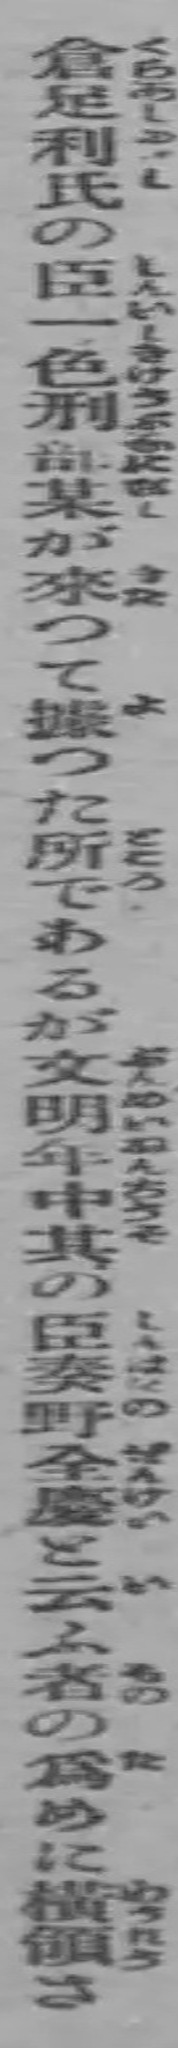倉足利氏の臣一色刑部某が来つて拠つた所であるが文明年中其の臣秦野全慶と云ふ者の為めの横領さ
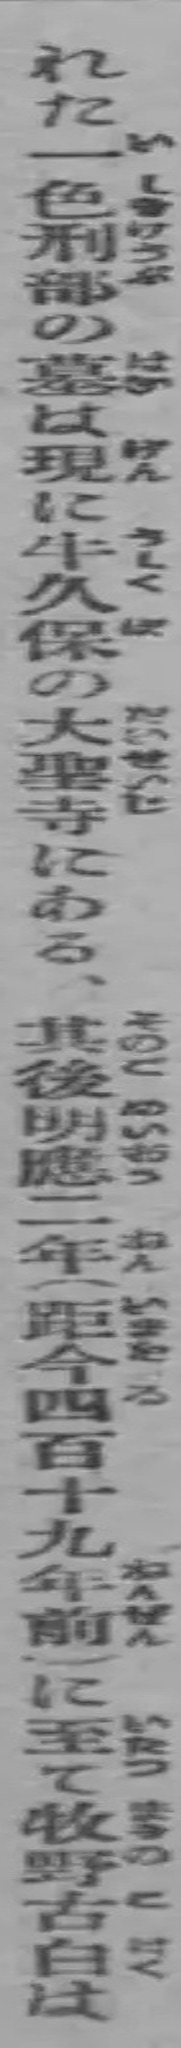れた一色刑部の墓は現に牛久保の大聖寺にある、其後明応二年(距今四百十九年前)に至て牧野古白は
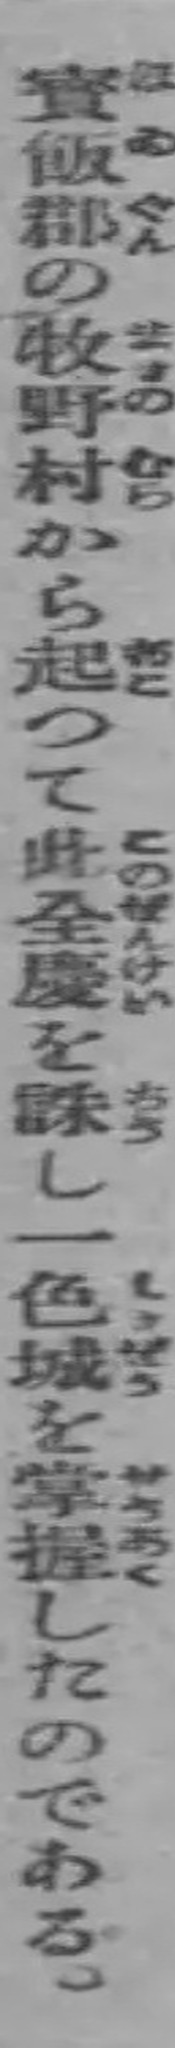宝飯郡の牧野村から起つて此全慶を誅し一色城を掌握したのである。

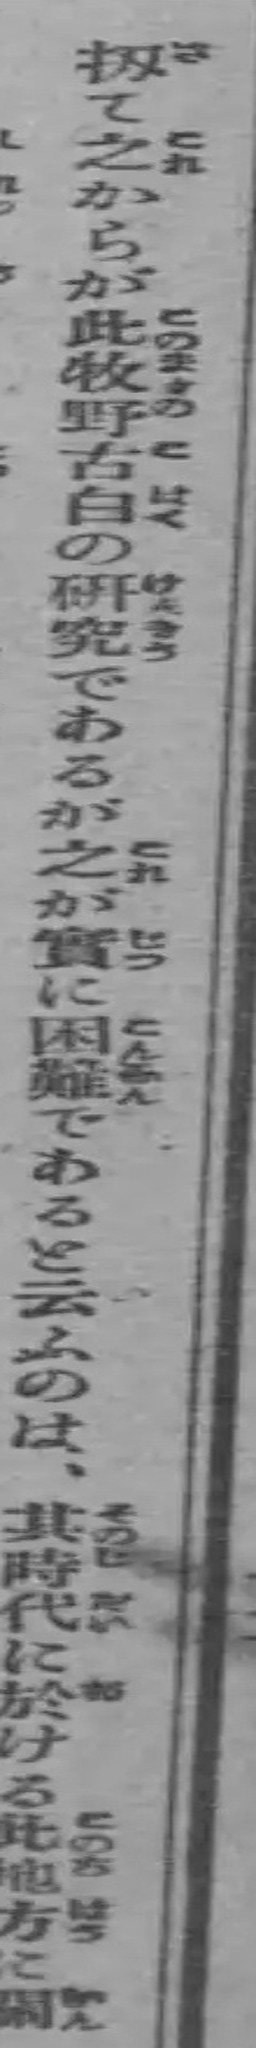古白の研究扨て之からが此牧野古白の研究であるが之が実に困難であると云ふのは、其時代に於ける此地方に関
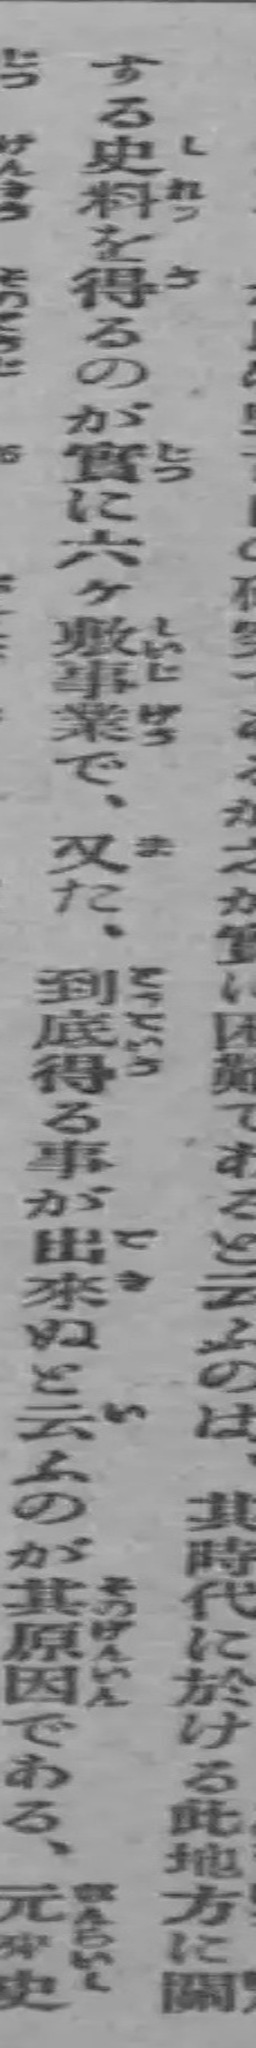する史料を得るのが実に六ケ敷事業で、又た、到底得る事が出来ぬと云ふのが其原因である、元来史
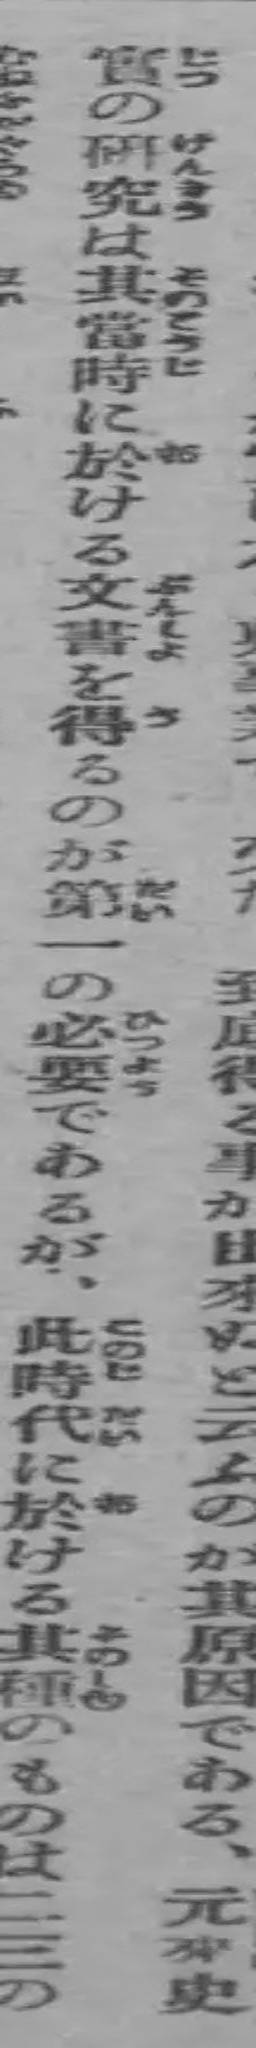実の研究は其当時に於ける文書を得るのが第一の必要であるが、此時代に於ける其種のものはニ三の
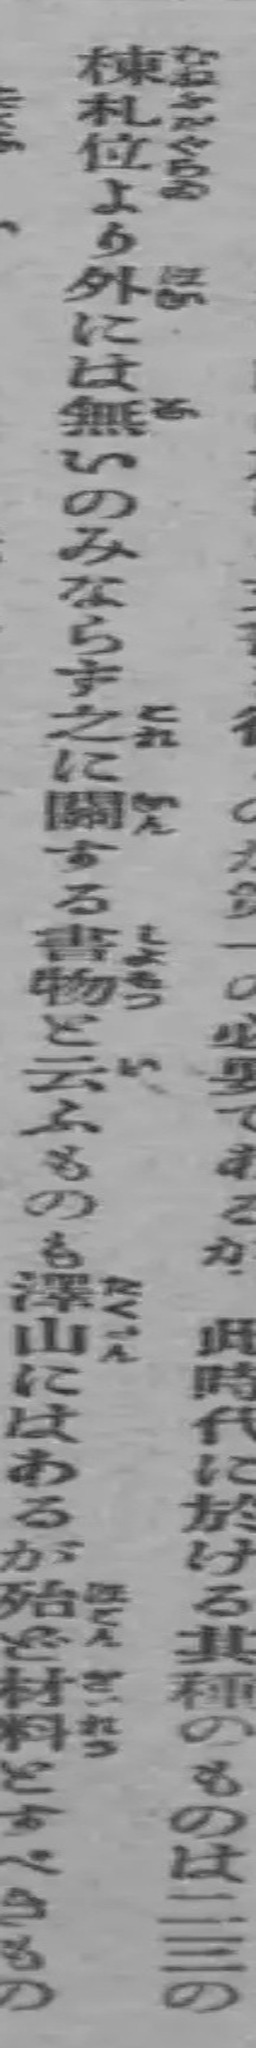棟札位より外には無いのみならず之に関する書物と云ふものも沢山にはあるが殆ど材料とすべきもの
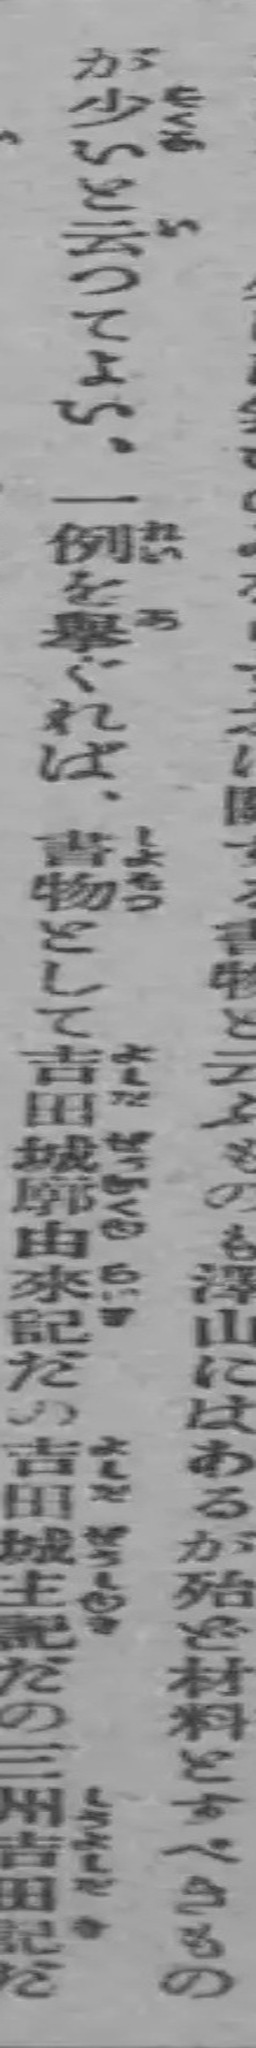が少いと云つてよい、一例を挙ぐれば、書物として吉田城廓由来記だの吉田城主記だの三州吉田記だ
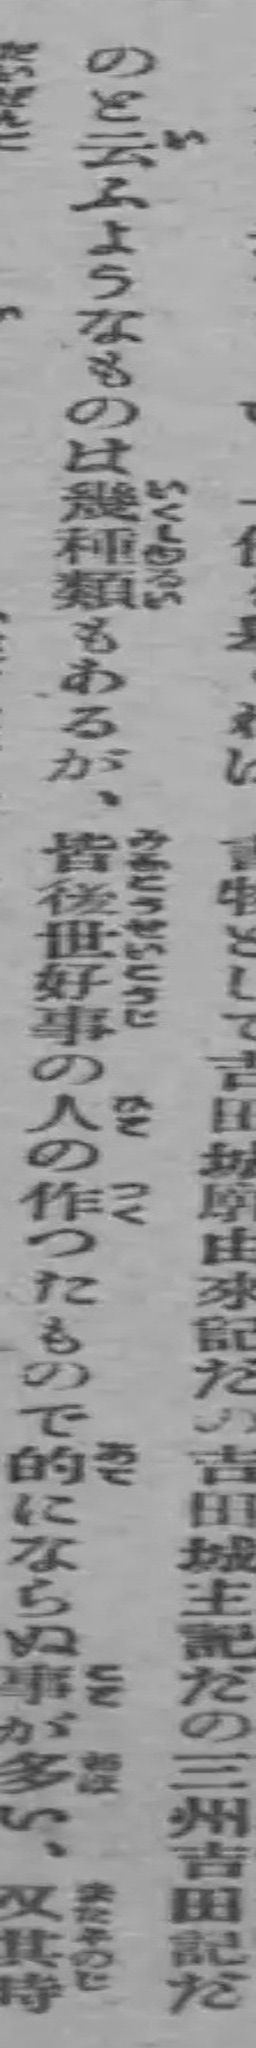のと云ふようなものは幾種類もあるが、皆後世好事の人の作つたもので的にならぬ事が多い、又其時
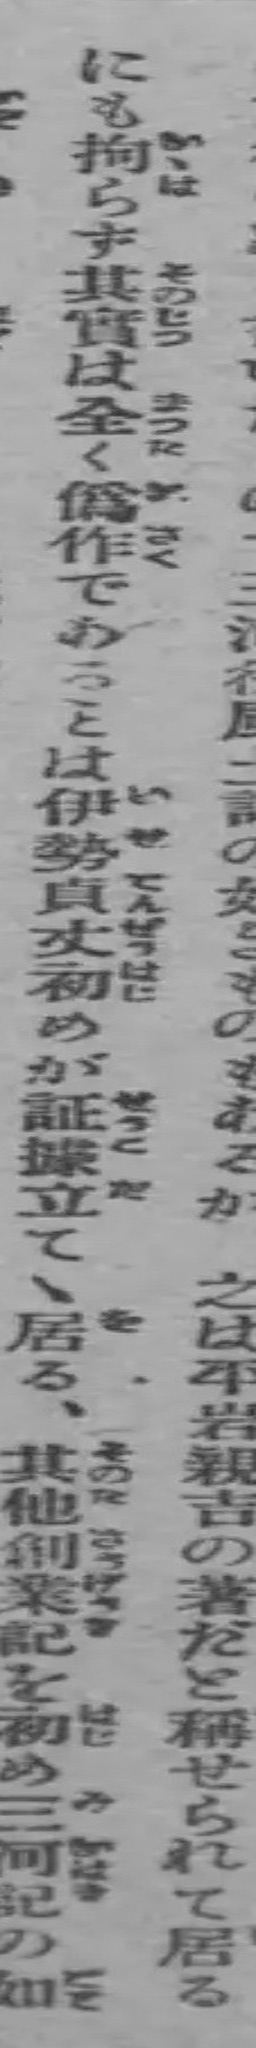にも拘らず其実は全く偽作であることは伊勢貞丈初めが証拠立てゝ居る、其他創業記を初め三河記の如
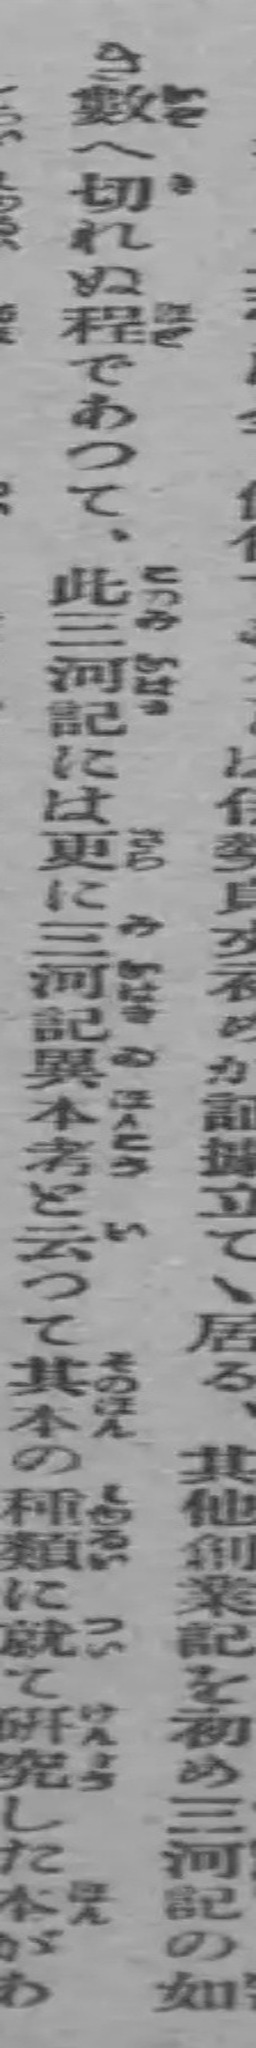き数へ切れぬ程であつて、此三河記には更に三河記異本考と云つて其本の種類に就て研究した本があ
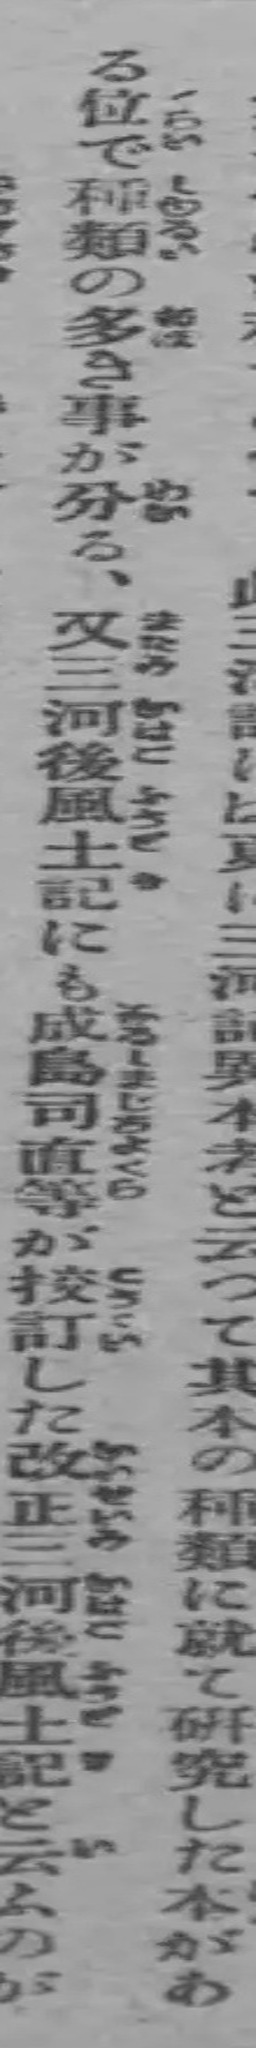る位で種類の多き事が分る、又三河後風土記にも成島司直等が校訂した改正三河後風土記と云ふのが
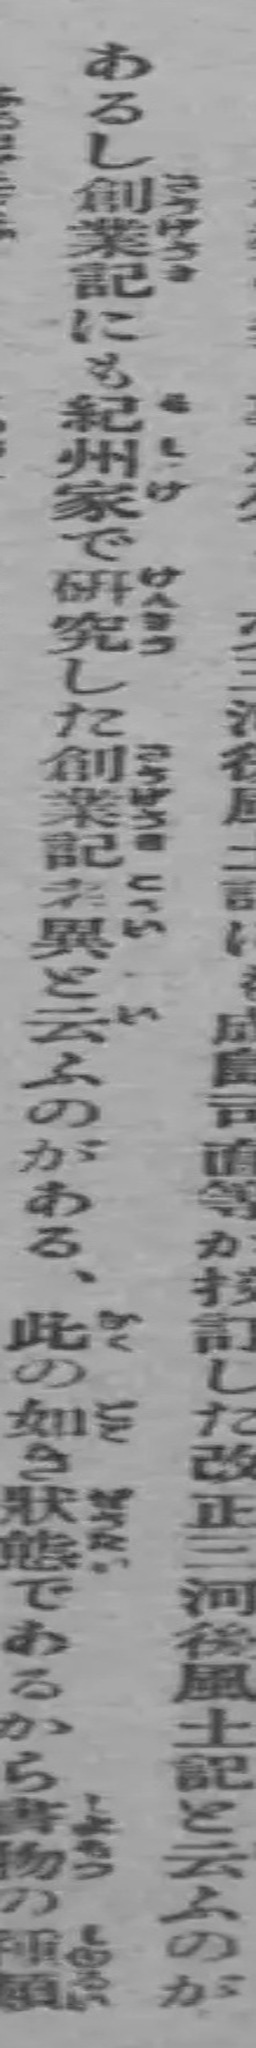あるし創業記にも紀州家で研究した創業記考異と云ふのがある、此の如き状態であるから書物の種類
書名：豊橋市史談
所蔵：国立国会図書館 National Diet Library, JAPAN
